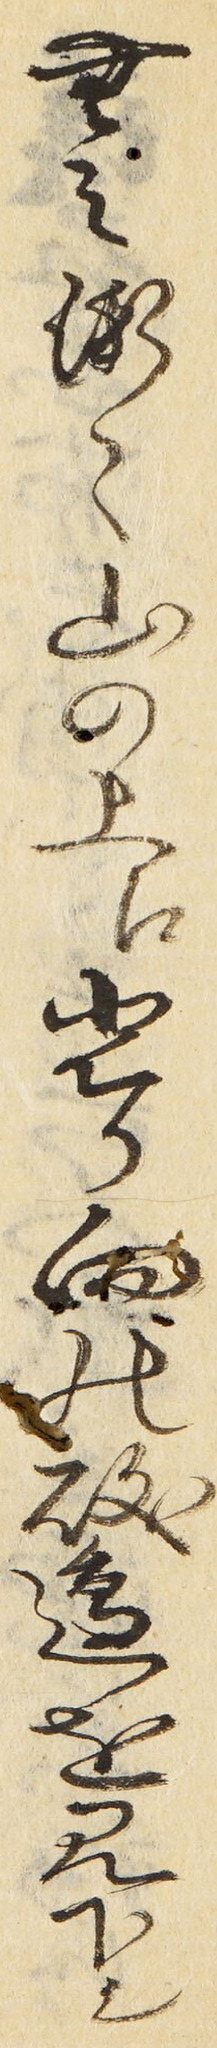無之漸々山の上江登り向の磯辺を見下シ
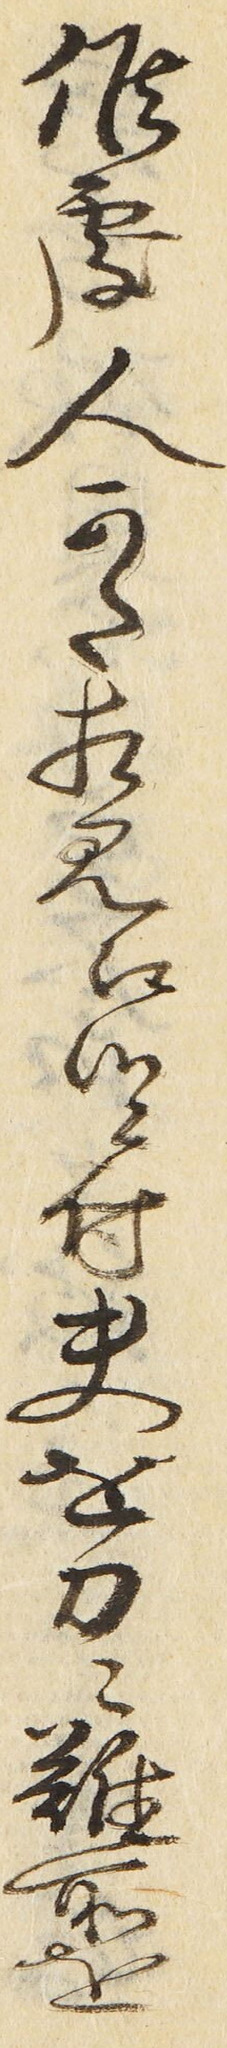候処人かた相見江候ニ付夫を力ニ難所を
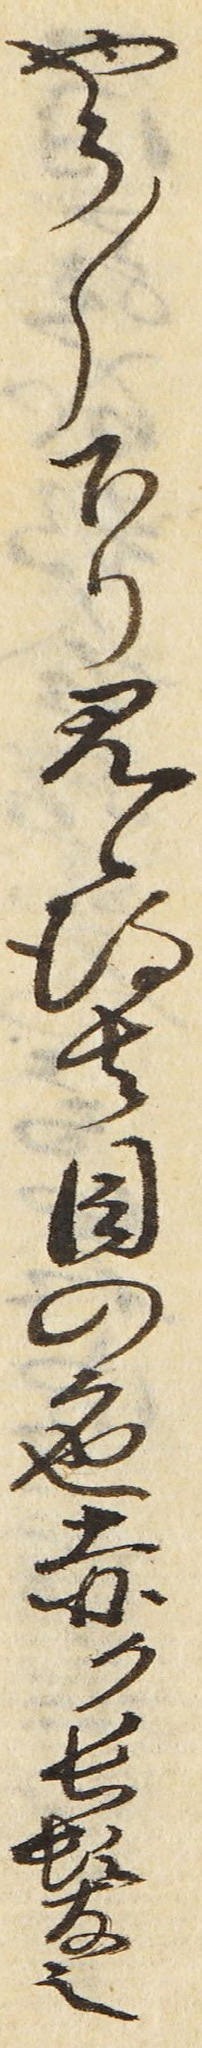やう〳〵下り見候得者目の色赤ク長髪之
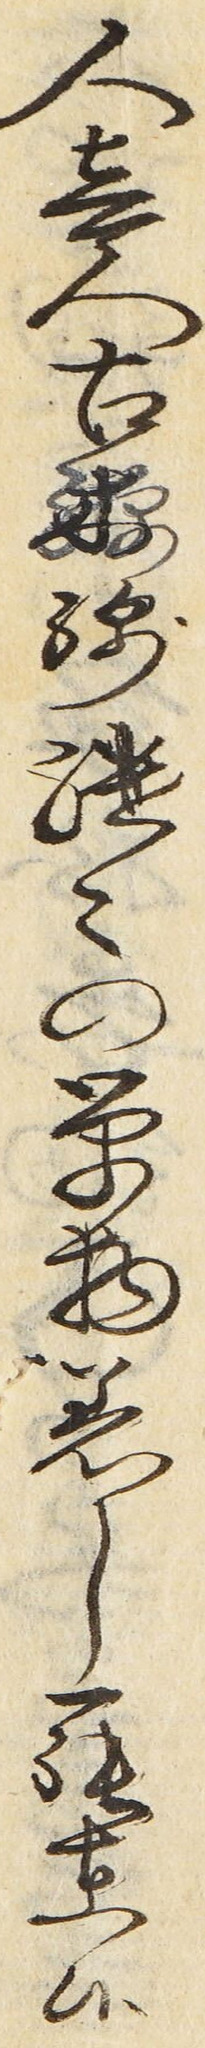人壱人古木綿継々の単物着し罷在候
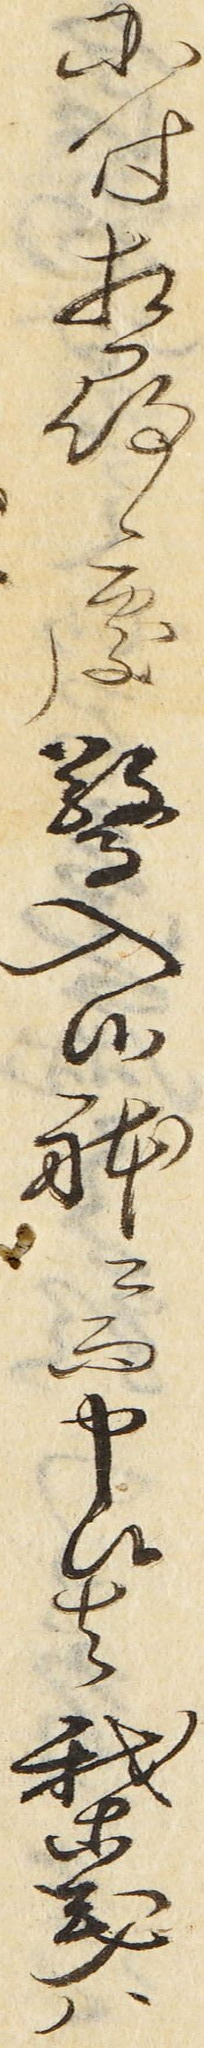に付相尋候処驚入候体ニ而申候者我等義ハ
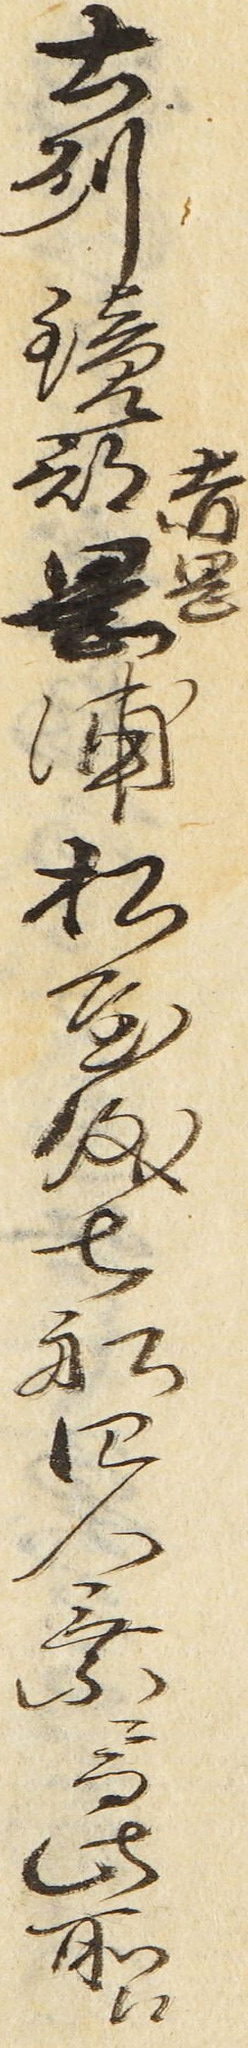土州鏡郡赤岡浦松屋儀七船四人乗ニ而此所江
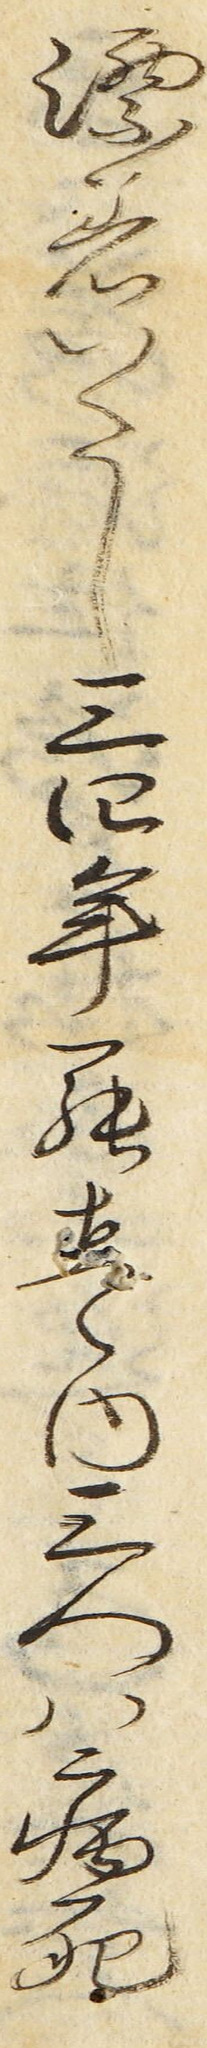漂着いたし三四年罷在候内三人ハ病死
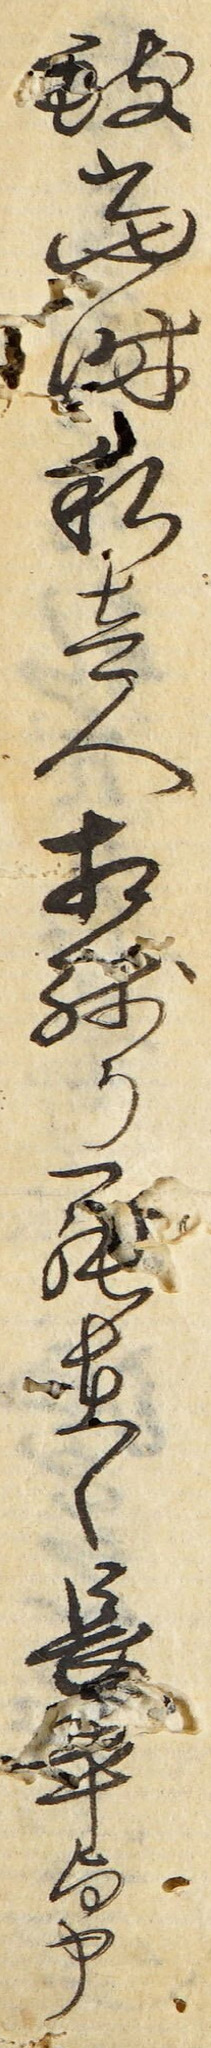致当時私壱人相残り罷在候長平与申

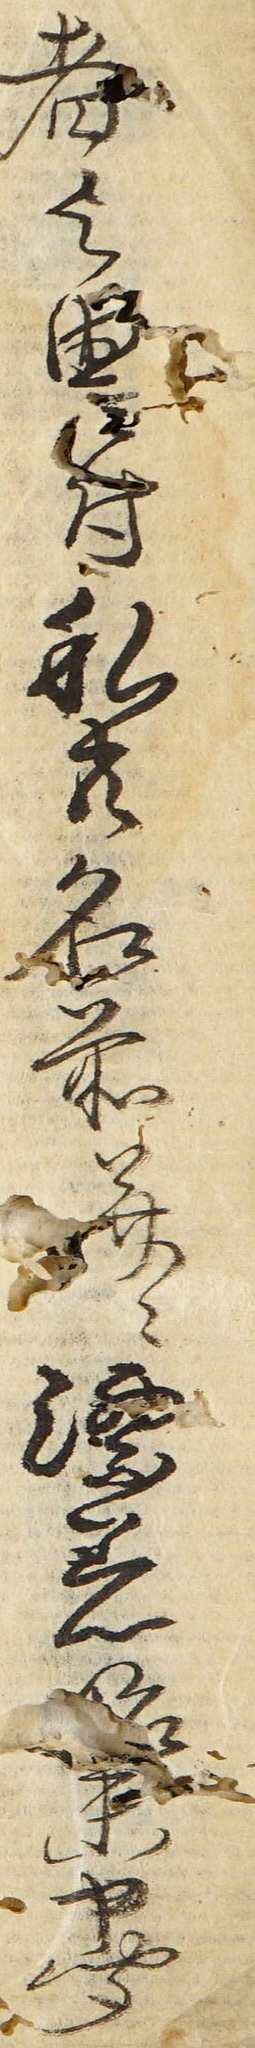者之由ニ付私共名前并ニ漂着始末申聞
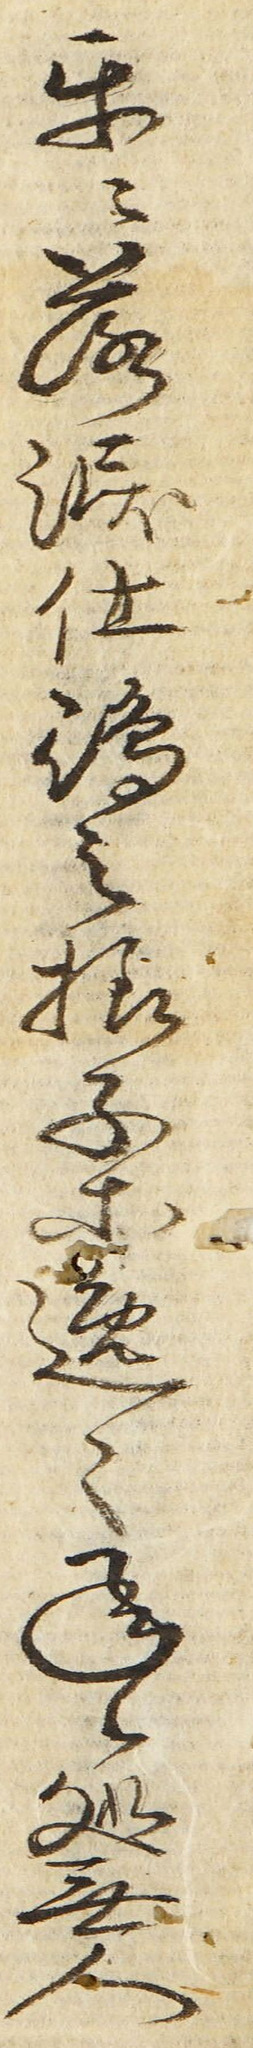互ニ落涙仕嶋之様子等逸々承候処無人
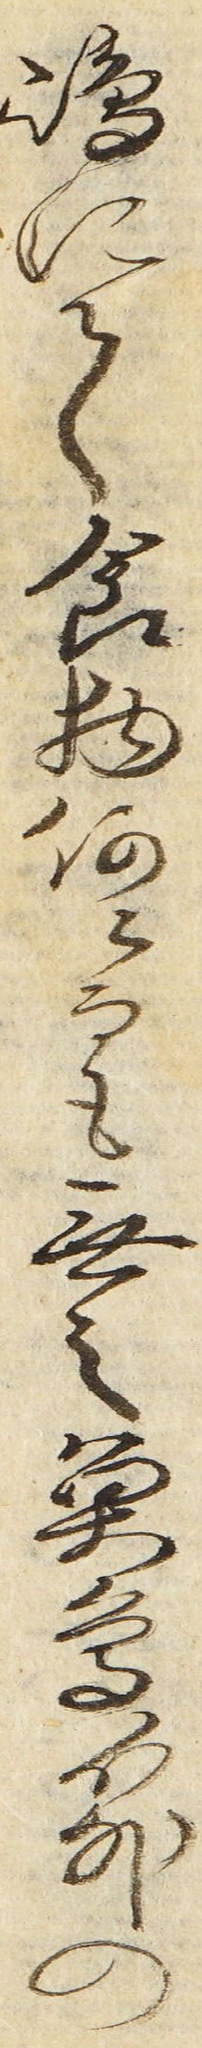嶋にて食物何ニ而も無之魚鳥ゟ外の
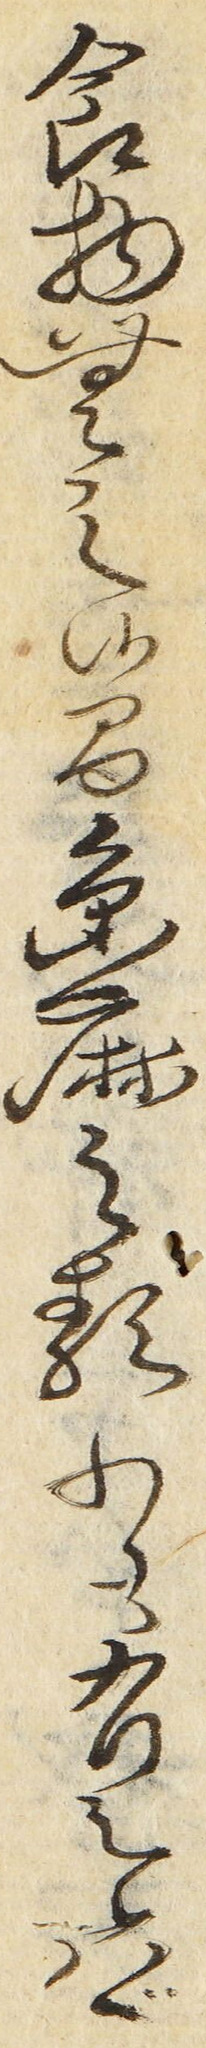食物無之候間糸麻之類少分有之候ハヾ
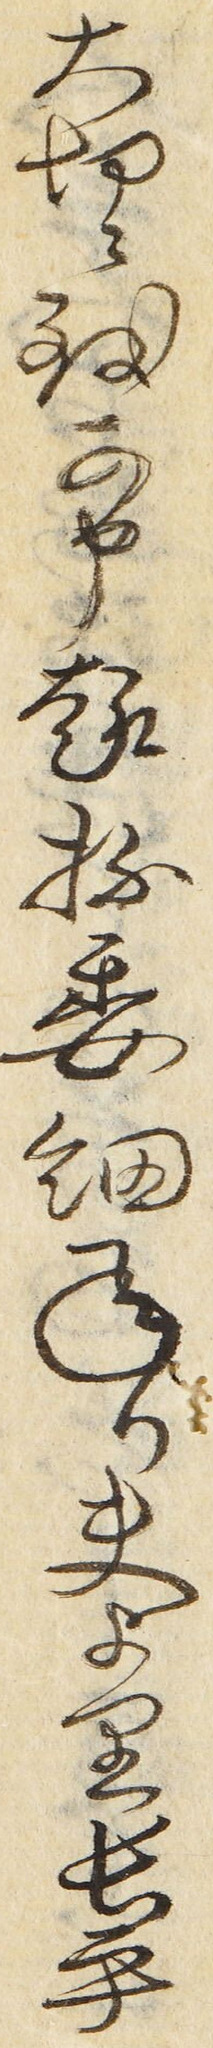大切ニ致可申趣抔委細承り夫より長平
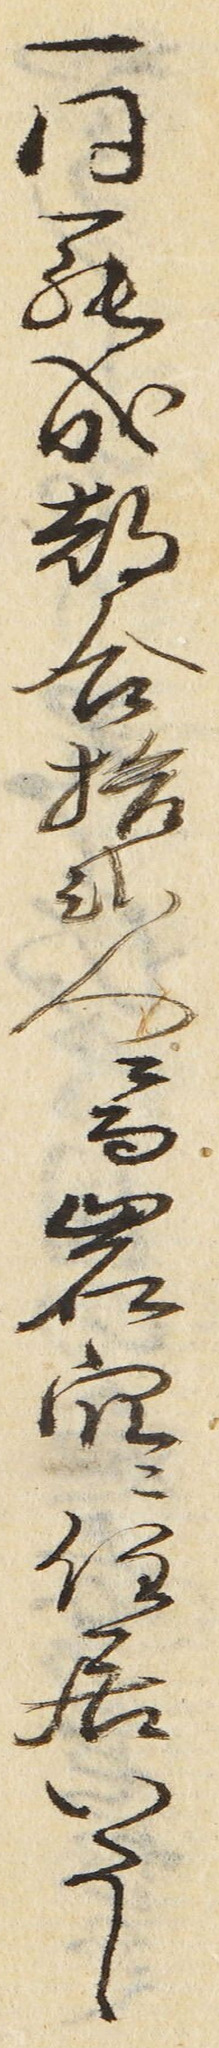一同罷成都合拾弐人ニ而岩穴ニ住居いたし
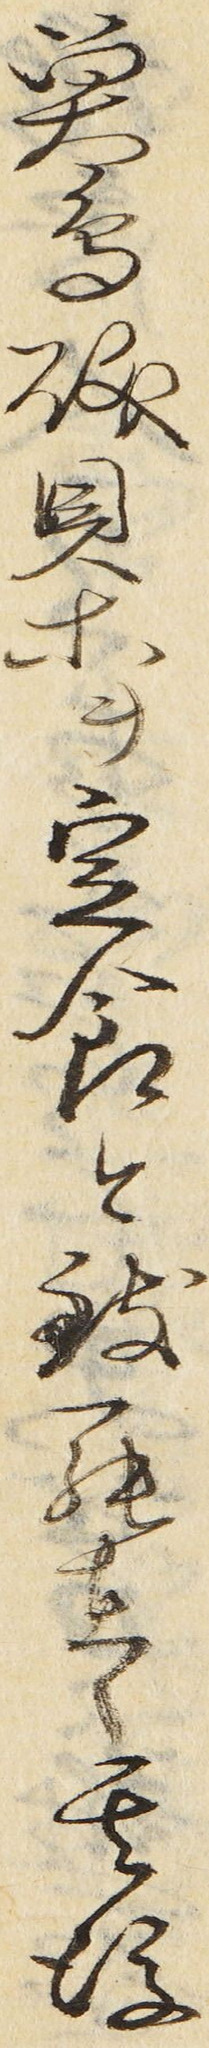魚鳥磯貝等ヲ定食と致罷在候其後
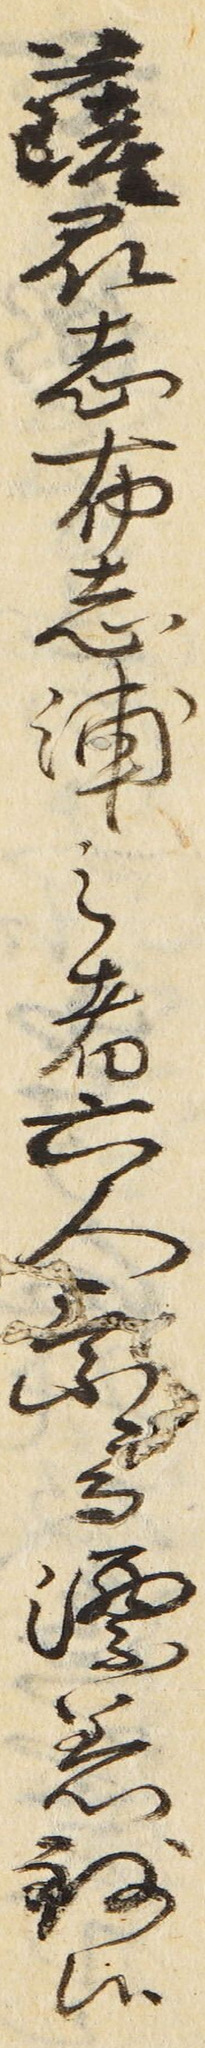薩州志布志浦之者六人乗ニ而漂着致候
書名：漂流一件上書
